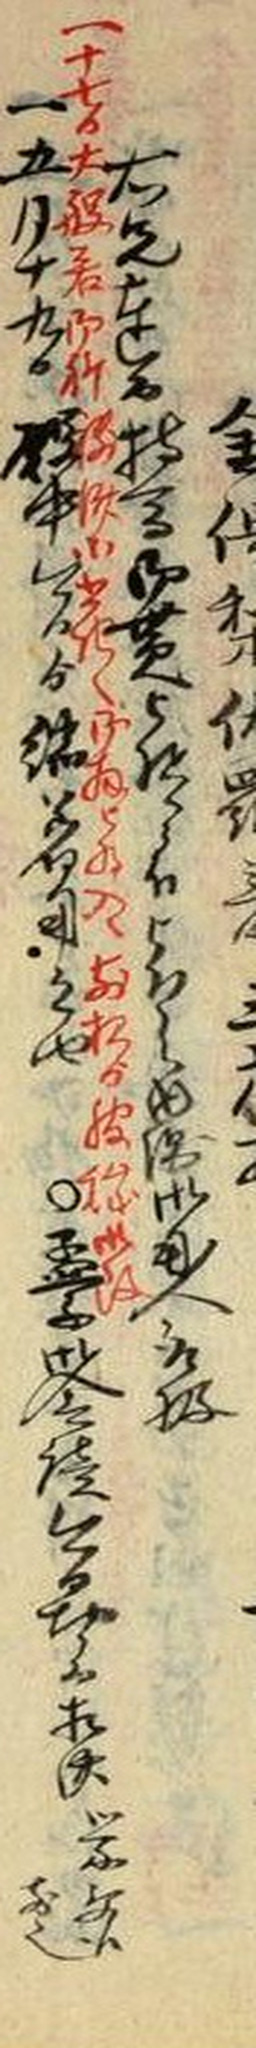一五月十九日殿中今日ゟ縮着用之由○孟子御会読今日切ニ而相済栄受取前也
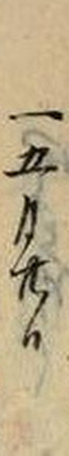一五月廿日
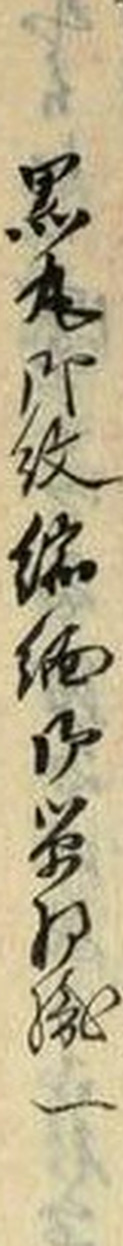黒丸御紋縮緬御単羽織一花木栄
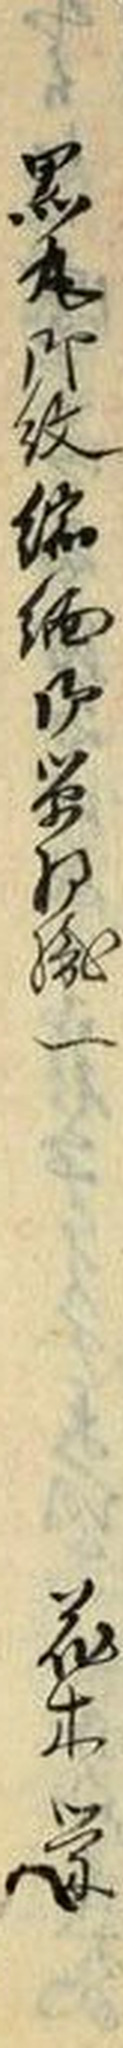黒丸御紋縮緬御単羽織一花木栄
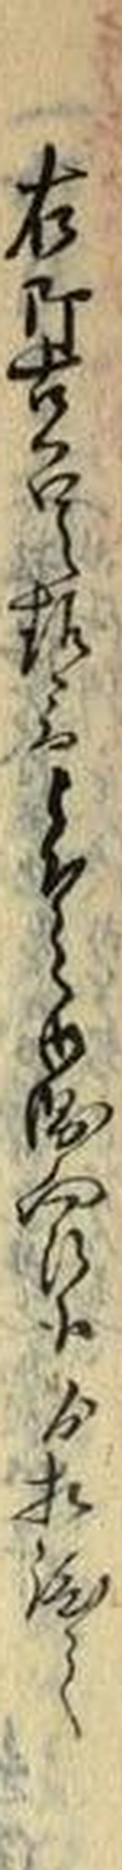右御古召之趣ニ而被下之御側向頭取ゟ相渡之
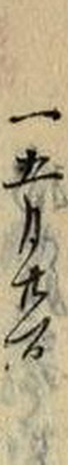一五月廿一日
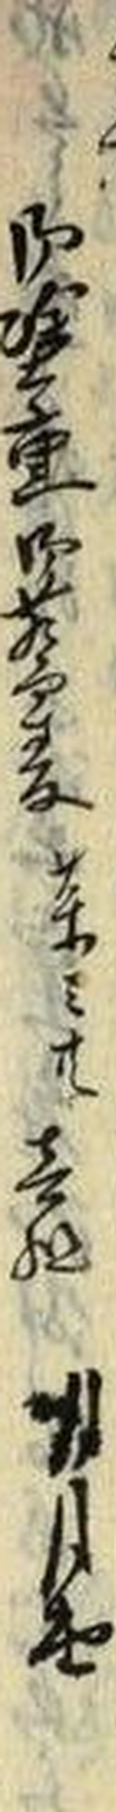御塗重御蕎麦薬ミ共壱組明月堂
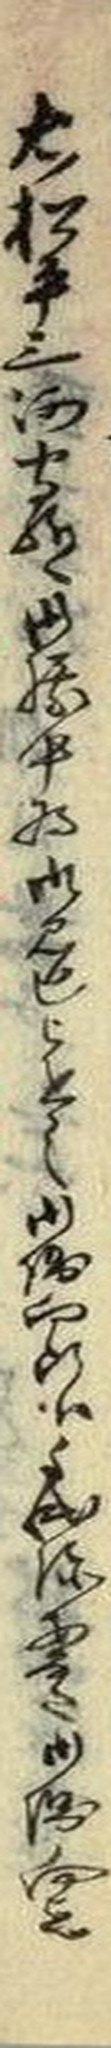右松平三河守様へ御朦中為御見廻被仕進之御側向頭取手紙添あなた御側向迄
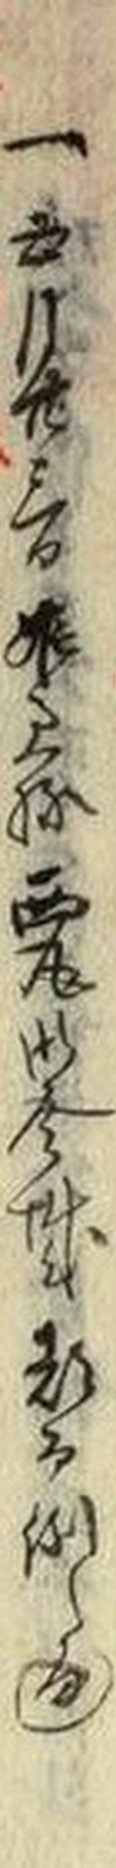一五月廿三日姫君様西丸御登城都而例之通
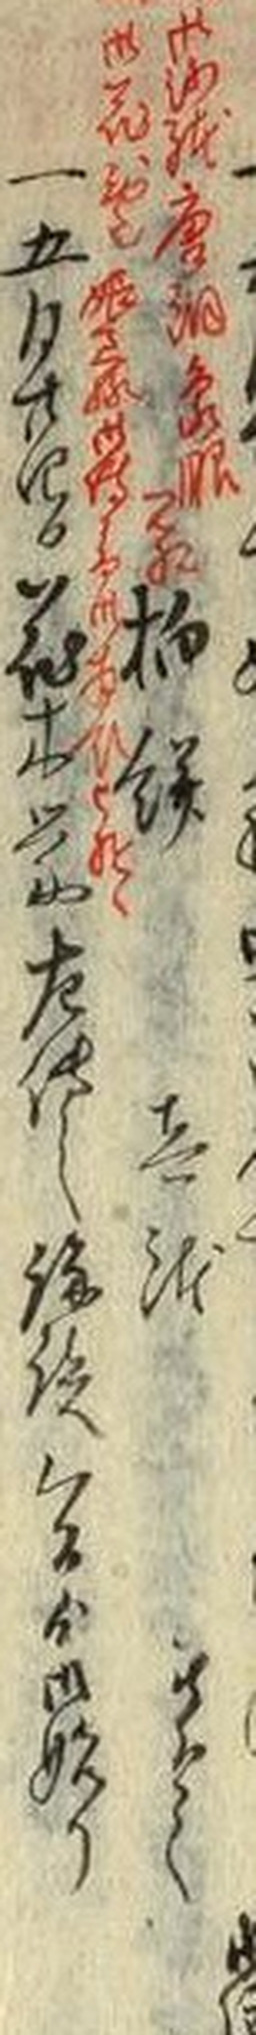一五月廿四日花木栄左伝之講読今日ゟ御始り
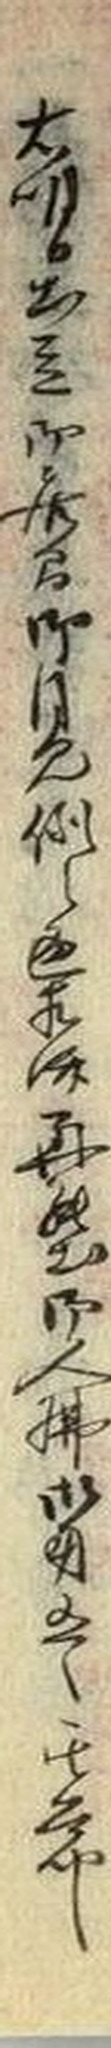右明日出立御居間御目見例之通相済再罷出御人払御用有之其節
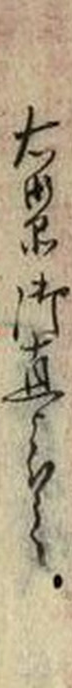右御品御直被下之
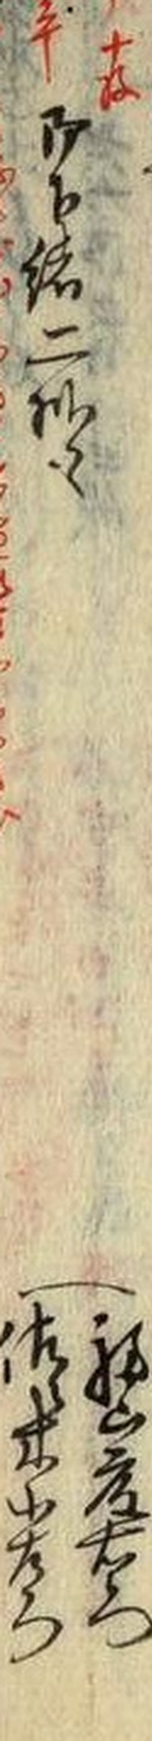御下緒二掛ツヽ福山藤右衛門
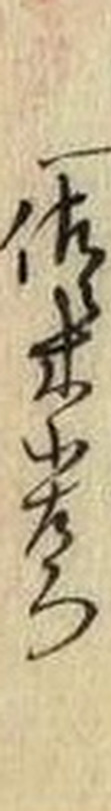佐々木小左衛門
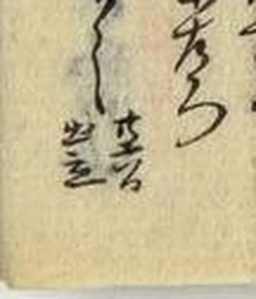廿五日

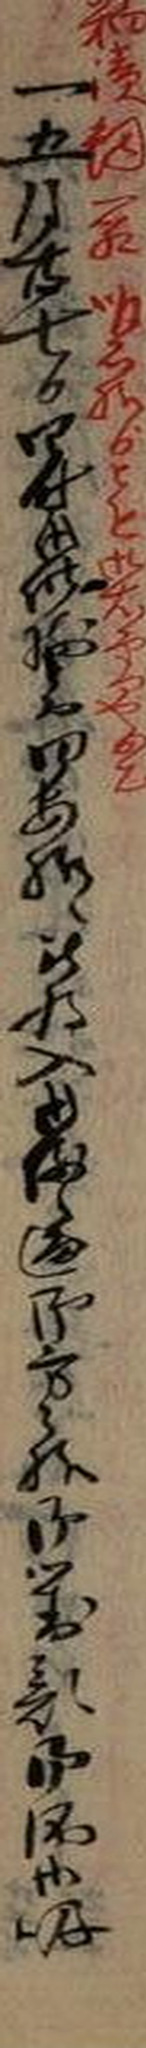一五月廿七日四時御供揃ニ而田安様へ被為入御例之通御方々様御対顔御酒御吸
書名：少傅日録抄（斉承付側向頭取日記、在府）
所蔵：福井県文書館 Fukui Prefectural Archives
